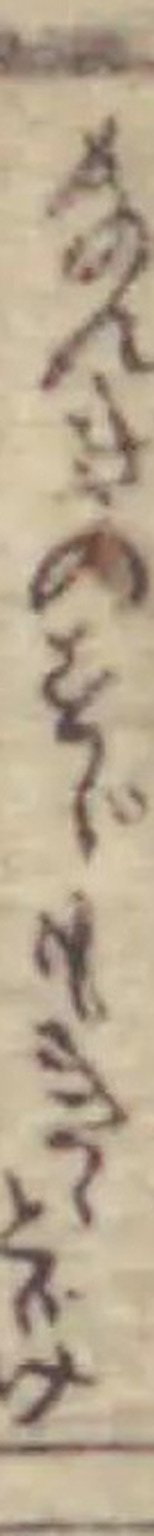なんぎのすじもきゝとゞけ
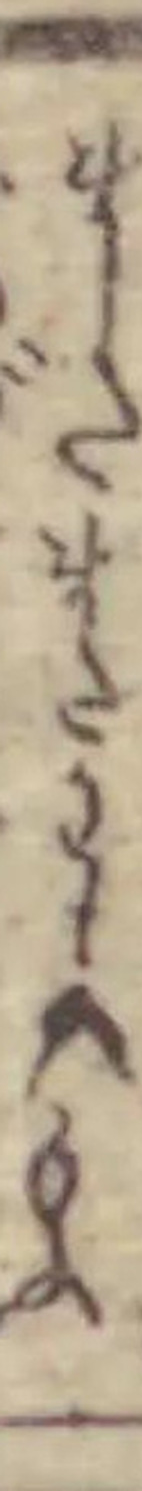ましたまたわしへもふ
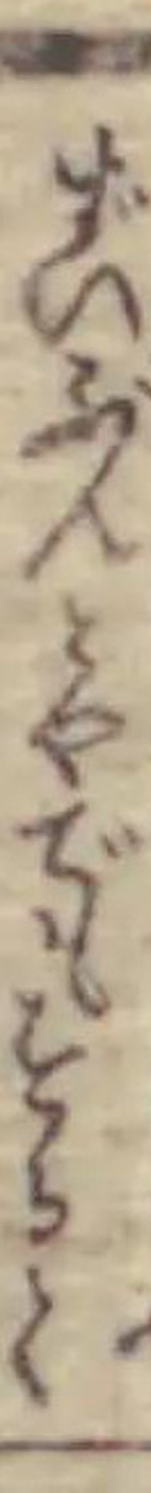ずいぶんとやでもをると
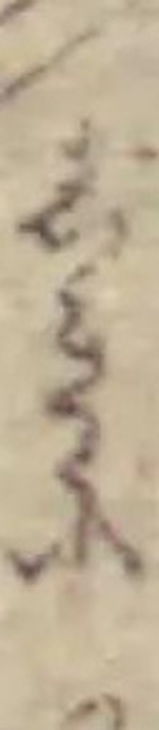じきに
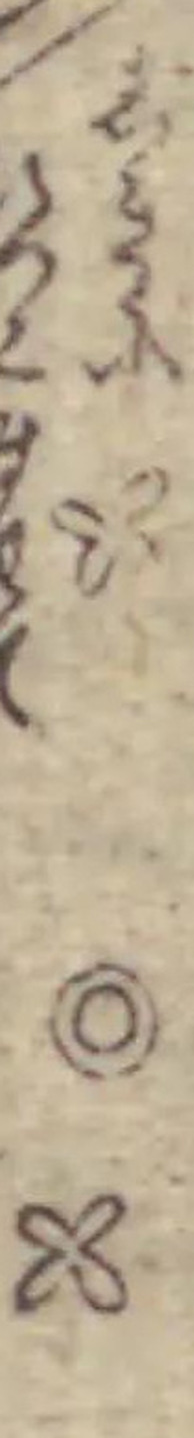ひつこませて
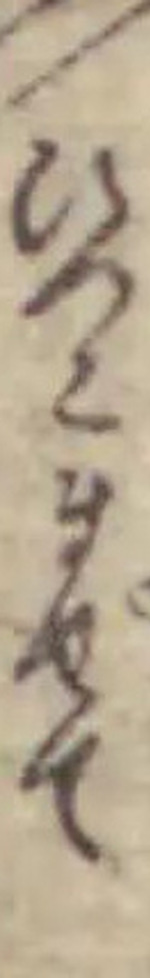ひつこませて
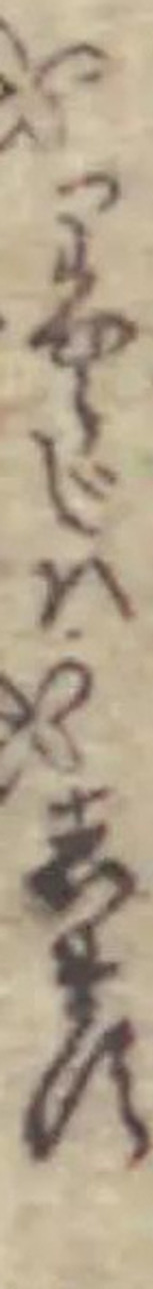りやうじはします
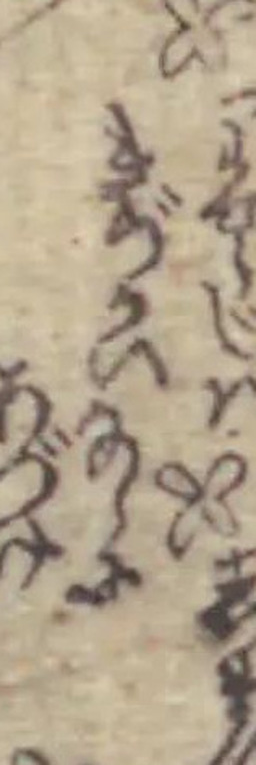きづかいならふ
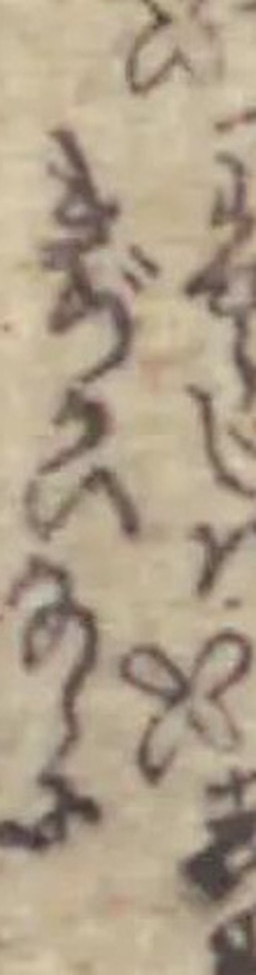きづかいならふ
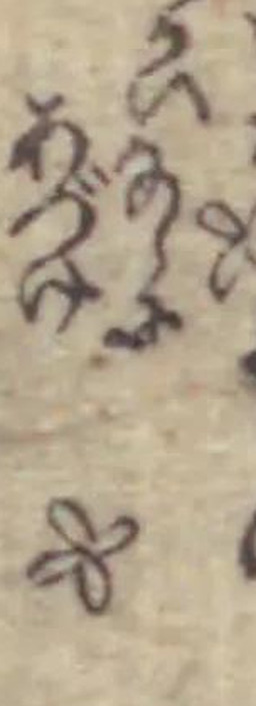あづけ
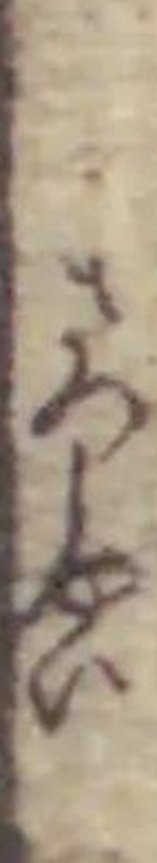さつしやい
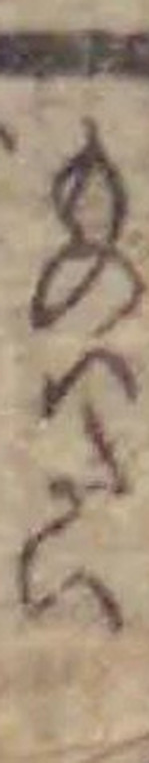ものはたい
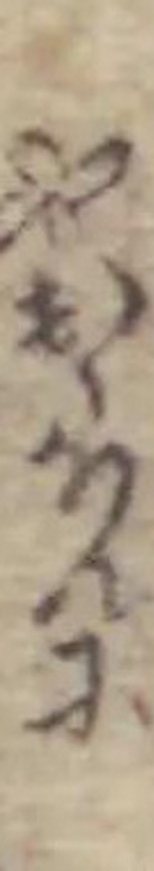おゝほんに
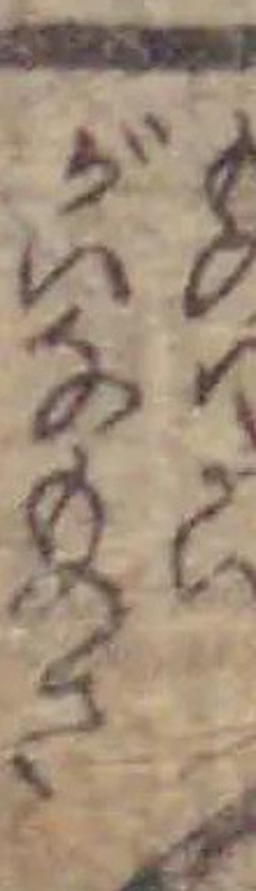がいなものさ
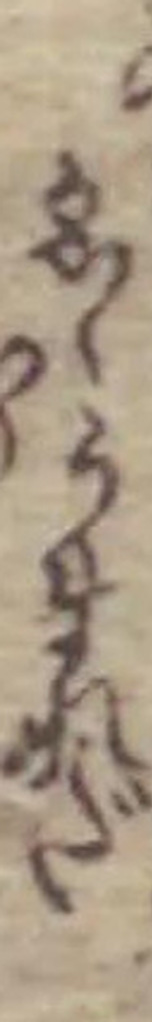ゑゝうまれだ
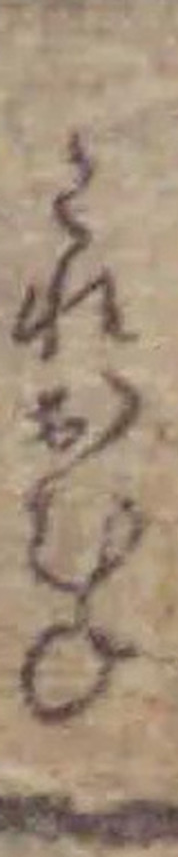これおむね
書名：奥州咄 3巻
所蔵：国立国会図書館 National Diet Library, JAPAN
